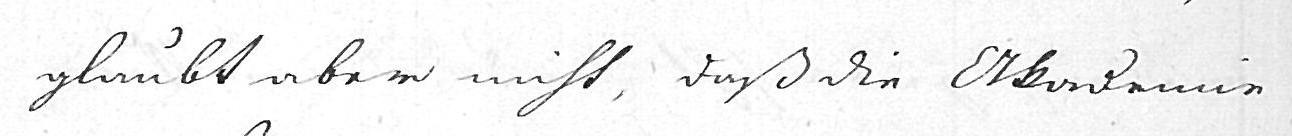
glaubt aber nicht, daß die Akademie
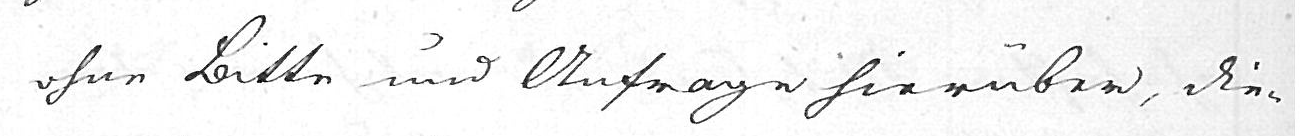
ohne Bitte und Anfrage hierüber, die-
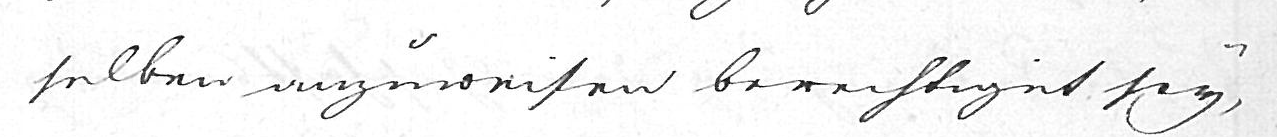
selben anzuweisen berechtigt sey,
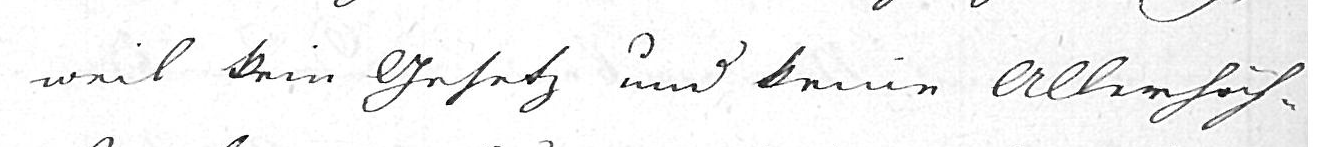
weil kein Gesetz und keine Allerhöch-
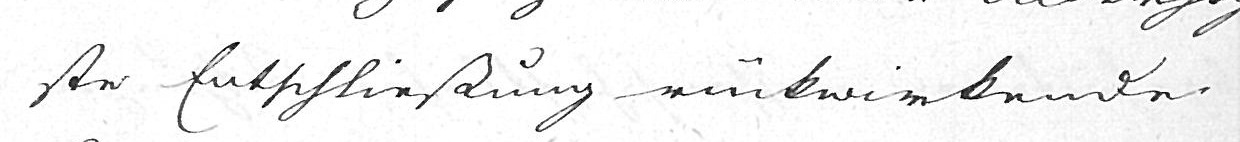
ste Entschließung rückwirkende
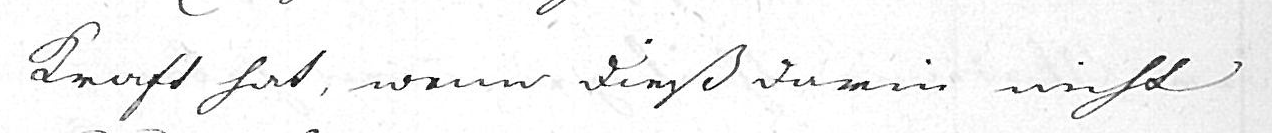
Kraft hat, wenn daß darin nicht
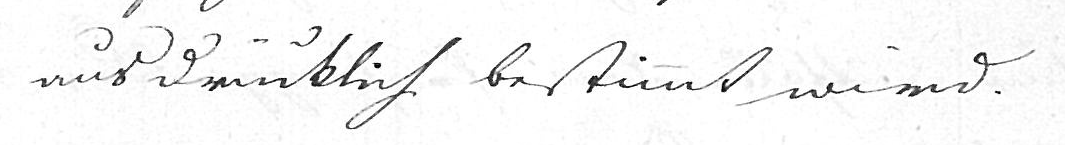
ausdrücklich bestimmt wird.
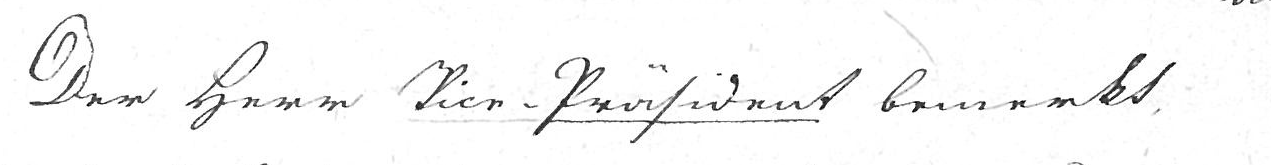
Der Herr Vice-Präsident bemerkt,
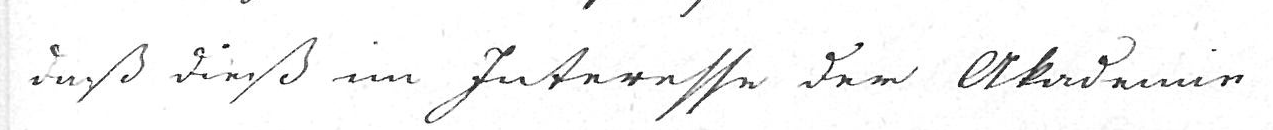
daß dieß im Interesse der Akademie
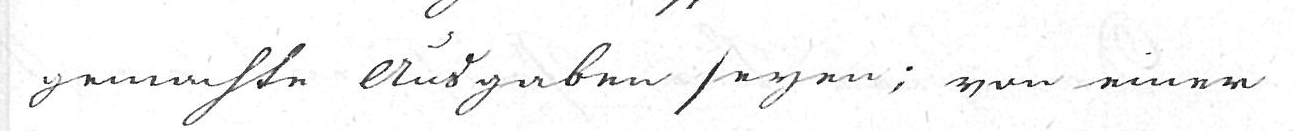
gemachte Ausgaben seyen; von einer
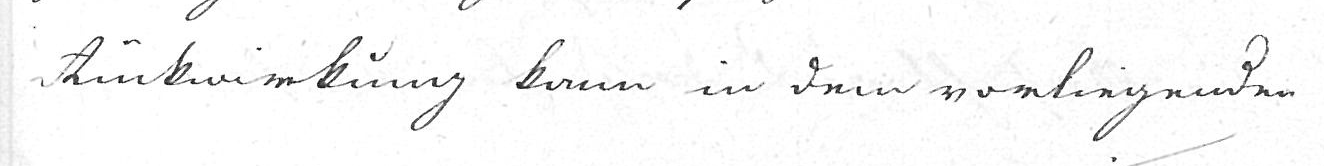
Rückwirkung kann in dem vorliegenden
